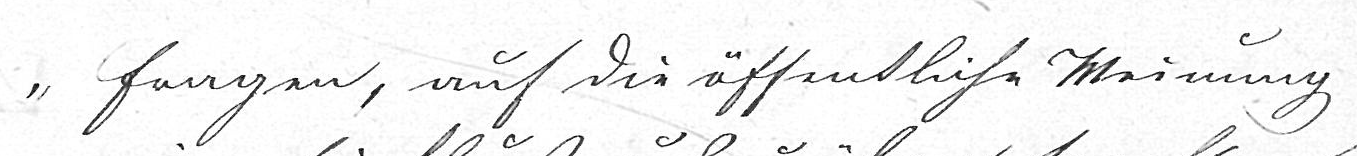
" fragen, auf die öffentliche Meinung
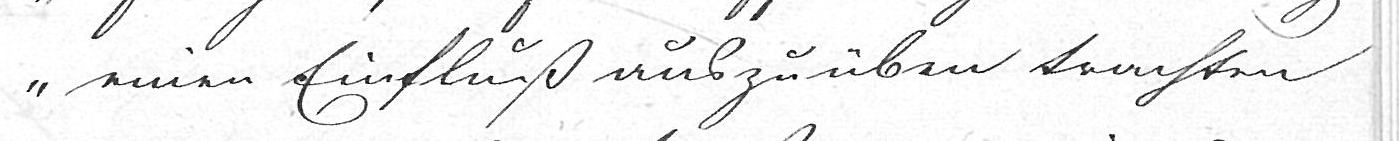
" einen Einfluß auszuüben trachten
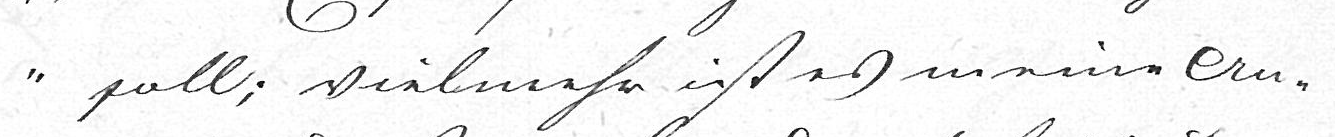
" soll; Vielmehr ist es meine An-
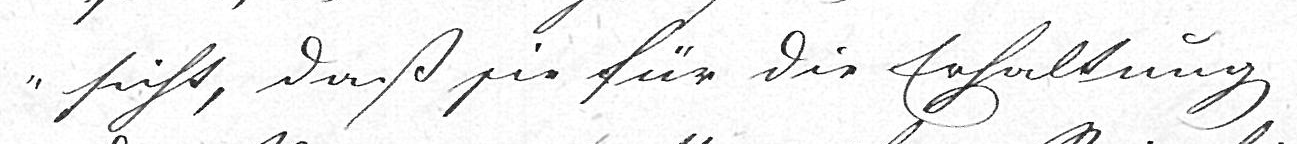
" sicht, daß sie für die Erhaltung
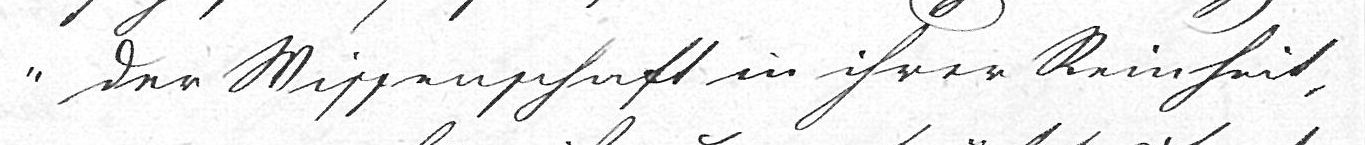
" der Wissenschaft in ihrer Reinheit
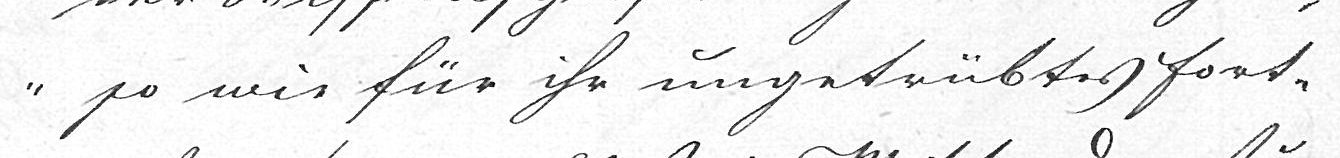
" so wie für ihr ungetrübtes Fort-
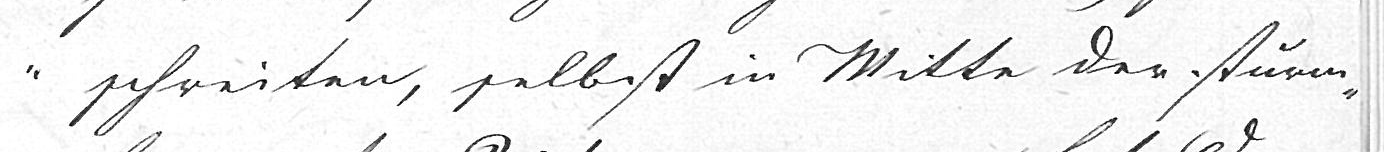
" schreiten, selbst in Mittel der sturm-
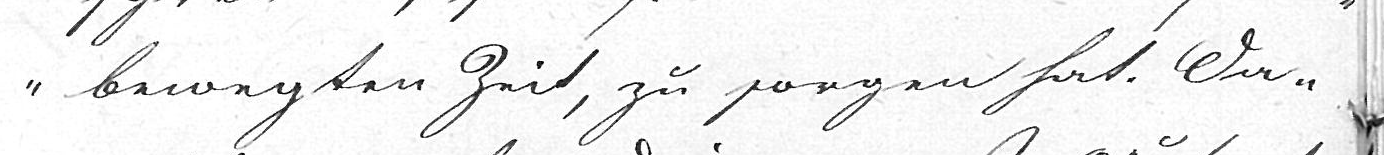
" bewegten Zeit, zu sorgen hat. Da-
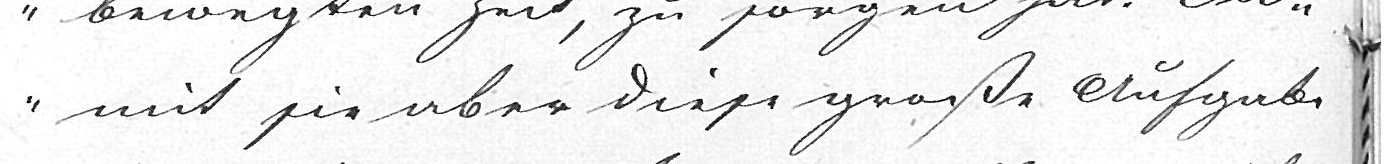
" mit sie aber diese große Aufgabe
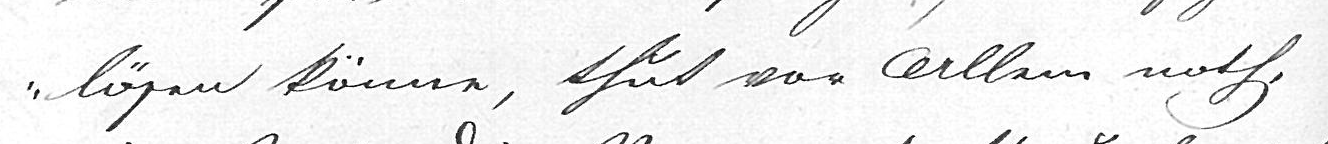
" lösen könne, thut vor allein noth,
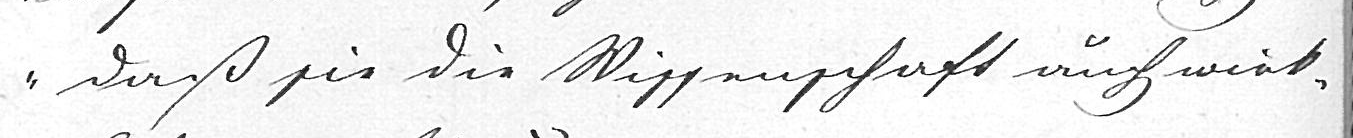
" daß sie die Wissenschaft auf wirk-
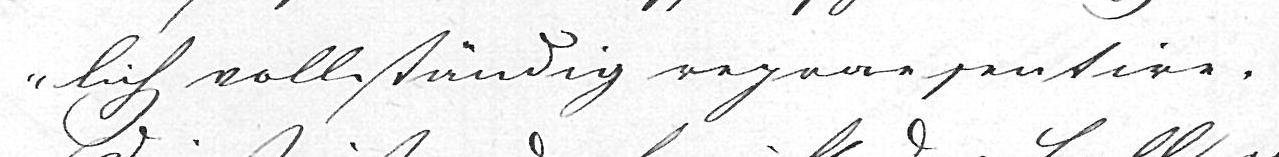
" lich vollständig eigene repraesentire.
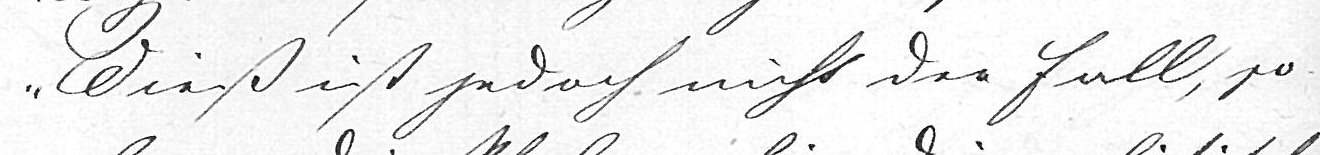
" Dieß ist jedoch nicht der Fall, so
